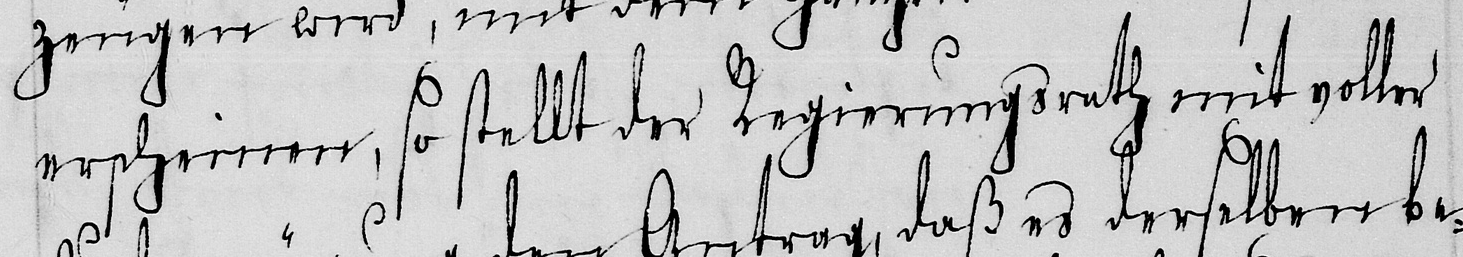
erscheinen, so stellt der Regierungsrath mit voller
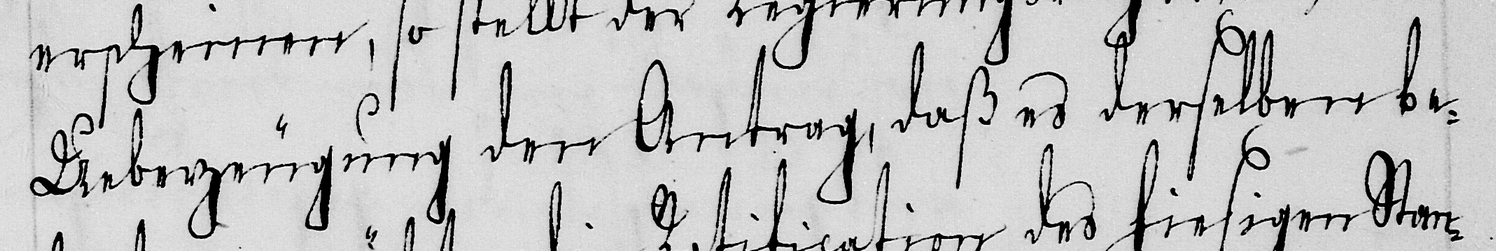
Ueberzeugung den Antrag, daß es derselben be¬
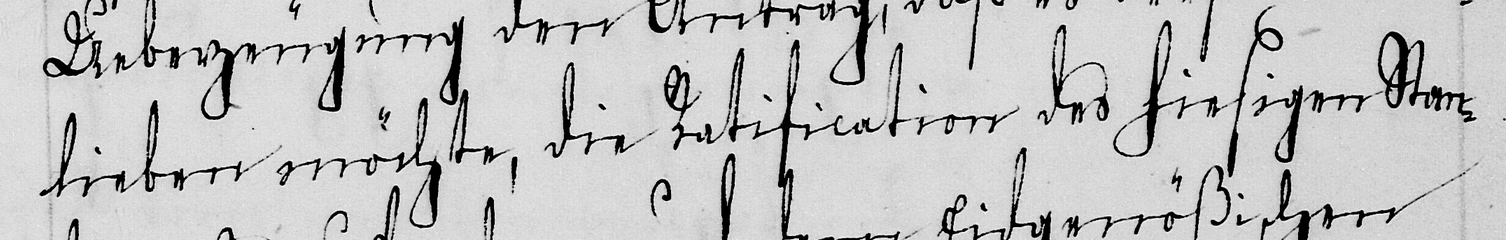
lieben möchte, die Ratification des hiesigen Stan¬
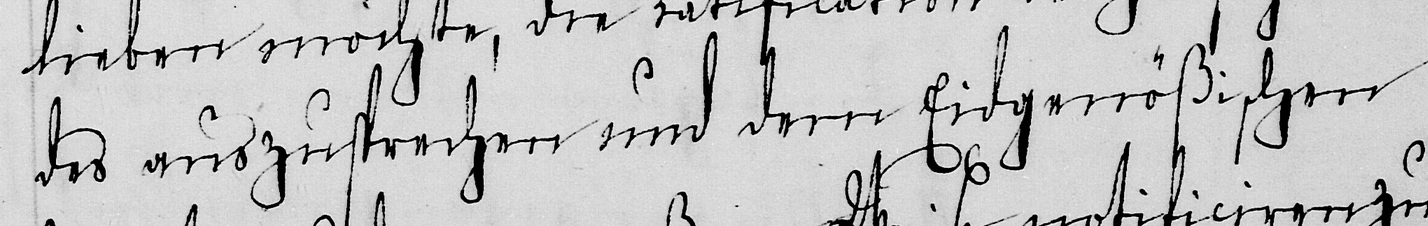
des auszusprechen und dem Eidgenößischen
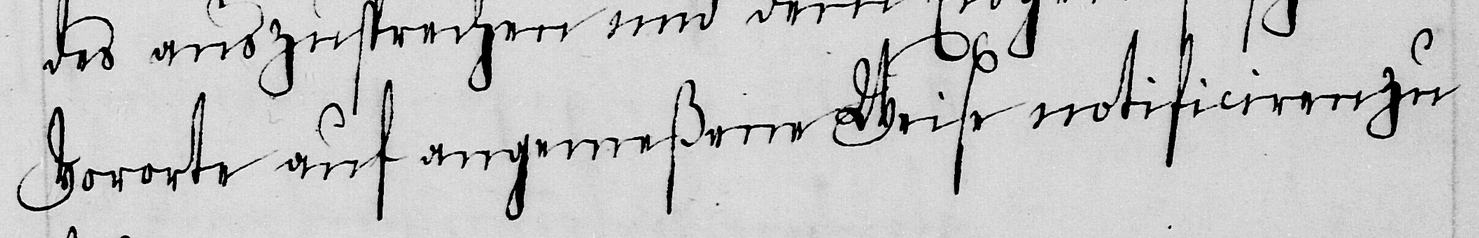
Vororte auf angemeßene Weise notificiren zu
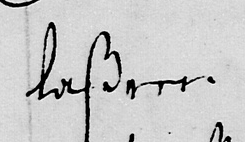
laßen.
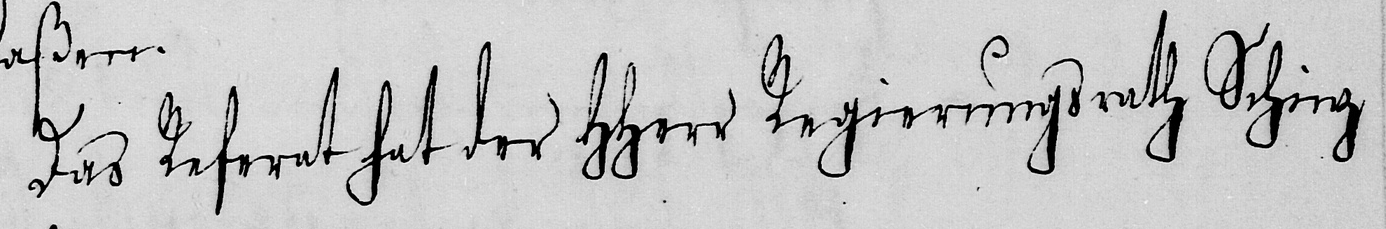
Das Referat hat der HHerr Regierungsrath Schinz
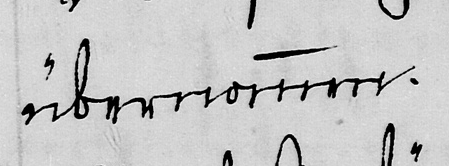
übernommen.
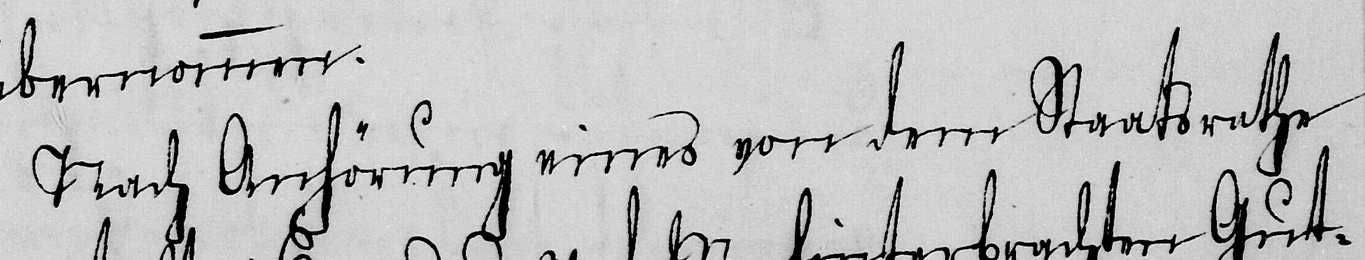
Nach Anhörung eines von dem Staatsrathe
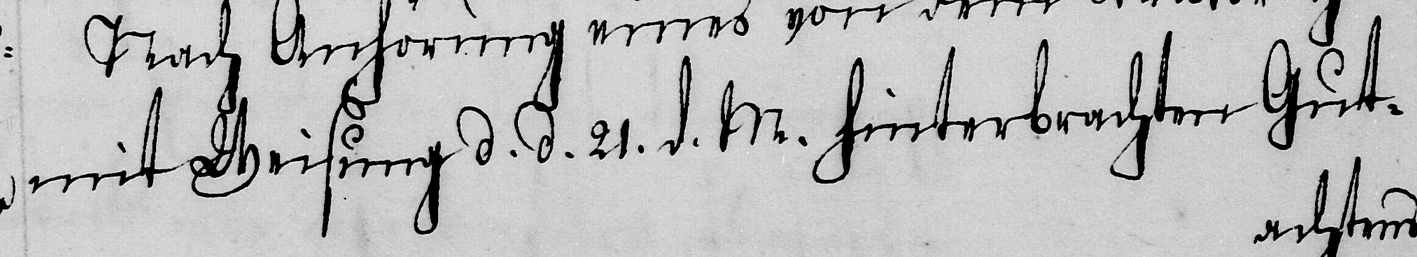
mit Weisung d. d. 21. d. M. hinterbrachten Gut-
